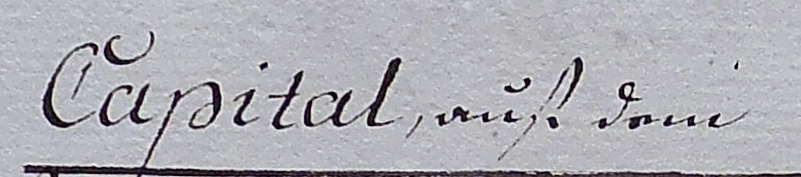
Capital, auf dem
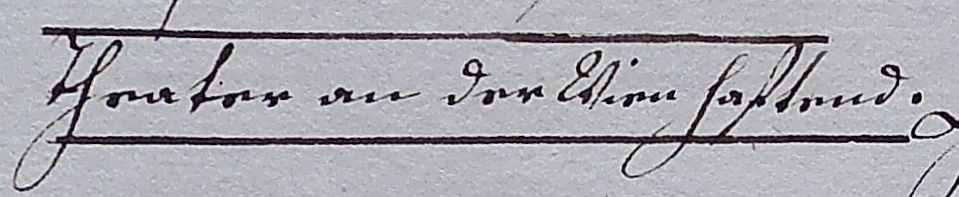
Theater an der Wien haltend.
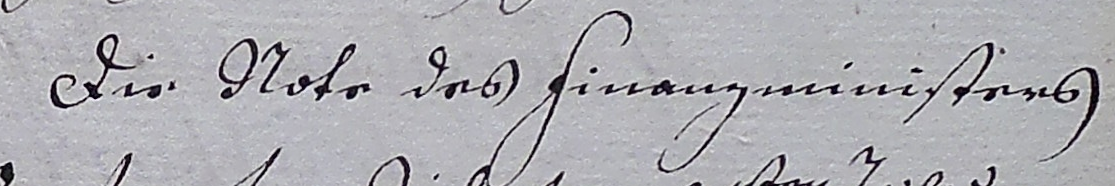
Die Note des Finanzministers
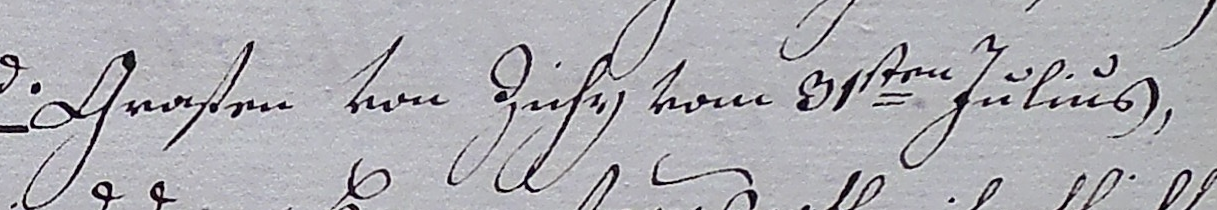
Grafen von Zichy vom 31te͇n Julius,
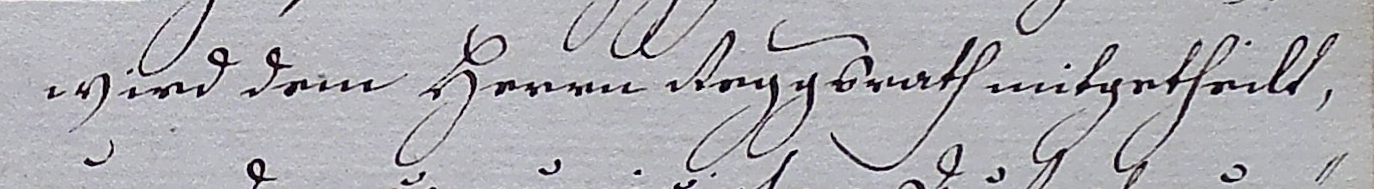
wird dem Herrn Reg͞gsrath mitgetheilt,
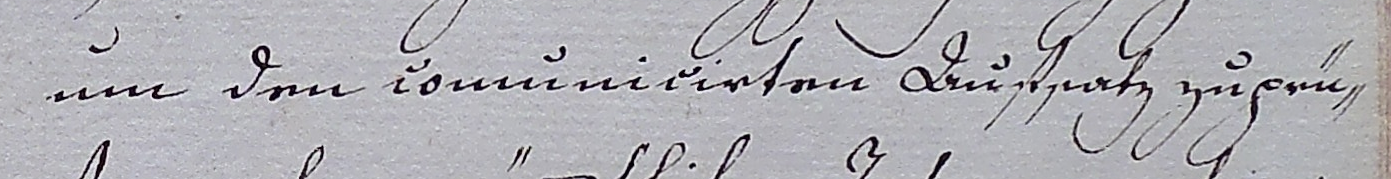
um den comunicirten Aufsatz zuprü¬
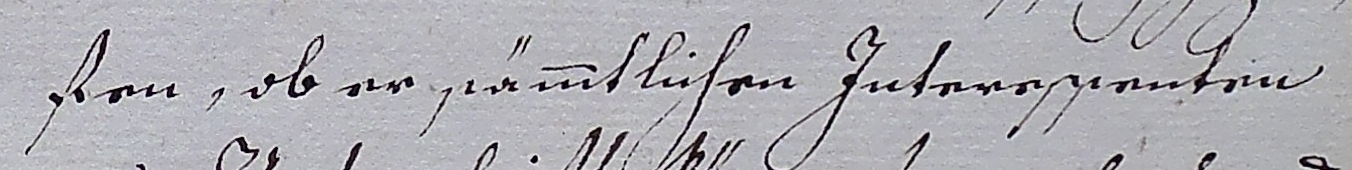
fen, ob er säm̅tlichen Interessenten
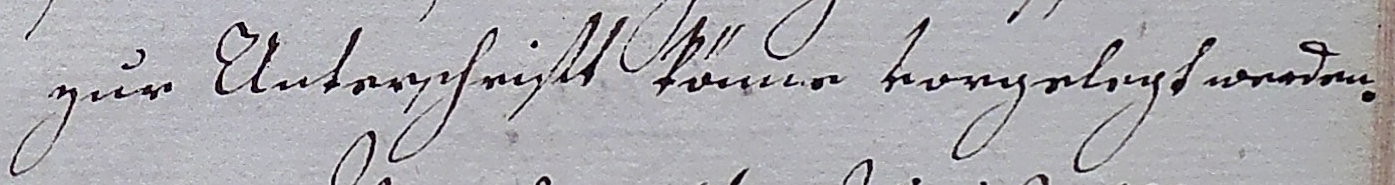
zur Unterschrift könne vorgelegt werden.
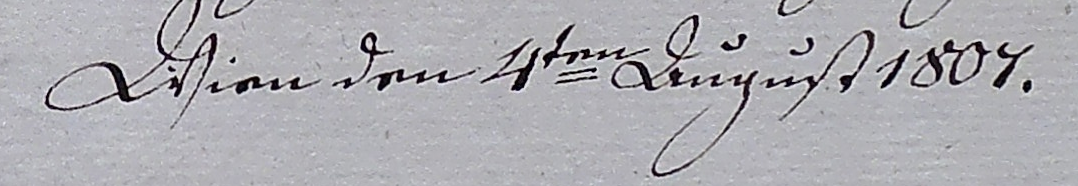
Wien den 4te͇n August 1807.
